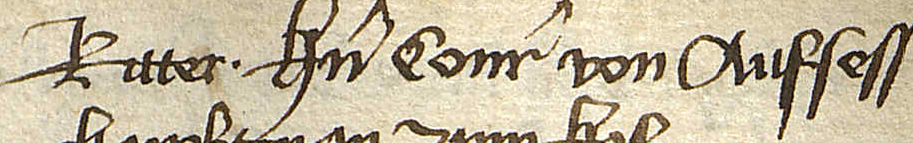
Ritter . Hn* Conr* von Aufſeſſ
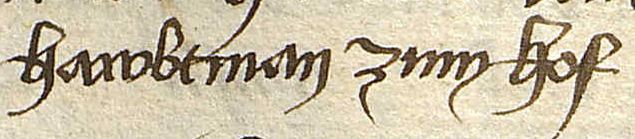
hawbtman ʒum Hof
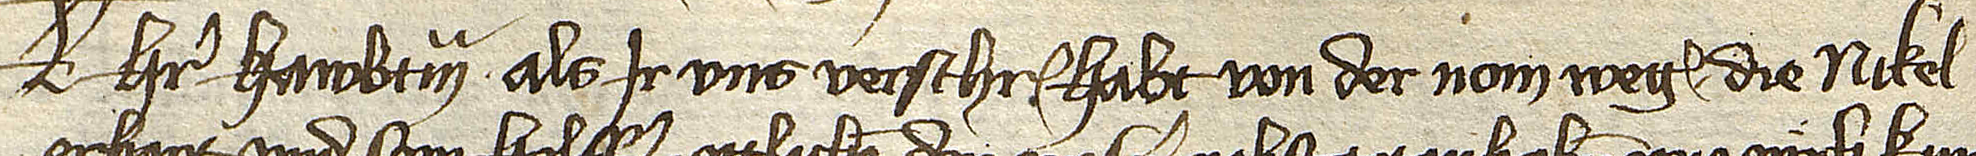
L* hr* hawbtm* . als Ir vns verſchr* habt von der nom weg* / die Nikel
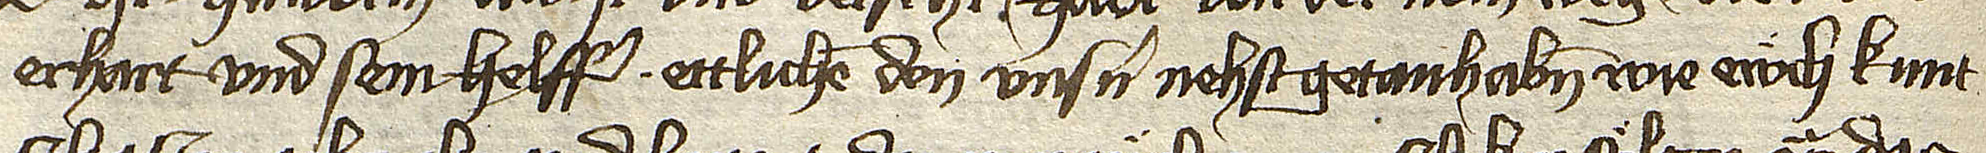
erhart vnd ſein helff* . ettliche* den vnſn* nehſt getan habn* wie eẅch kunt
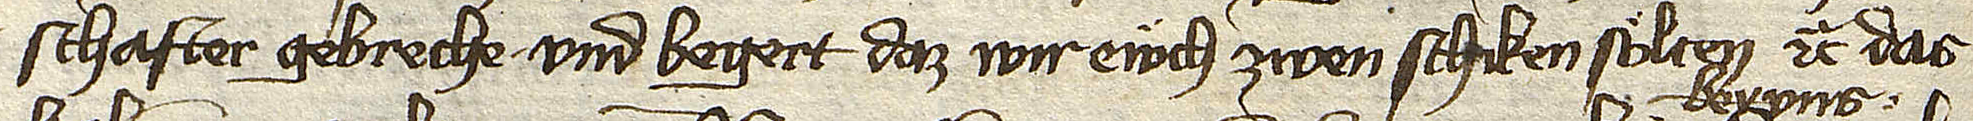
ſchafter gebreche / vnd begert daʒ wir eẅch ʒwen ſchiken ſölten ec* das
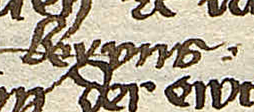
bey vns
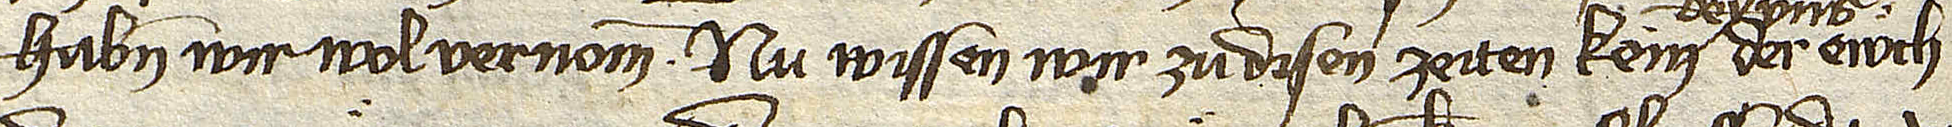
habn* wir wol vernom* . Nu wiſſen wir ʒu diſen ʒeiten kein* der eẅch
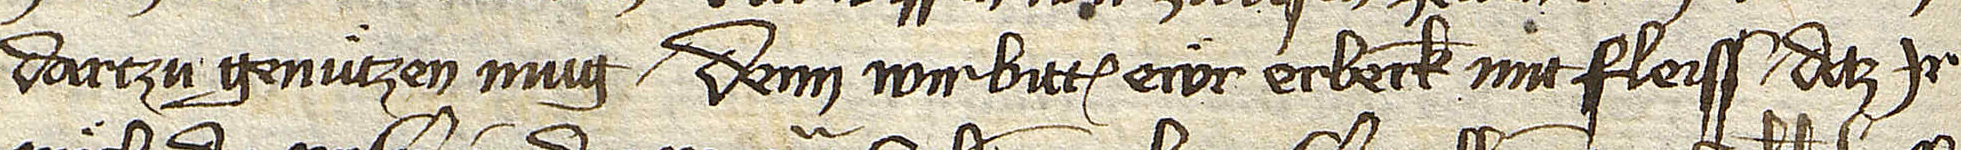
dartʒu genücʒen mug / Denn wir bitt* eẅr erberk* mit fleiſſ / daʒ Ir
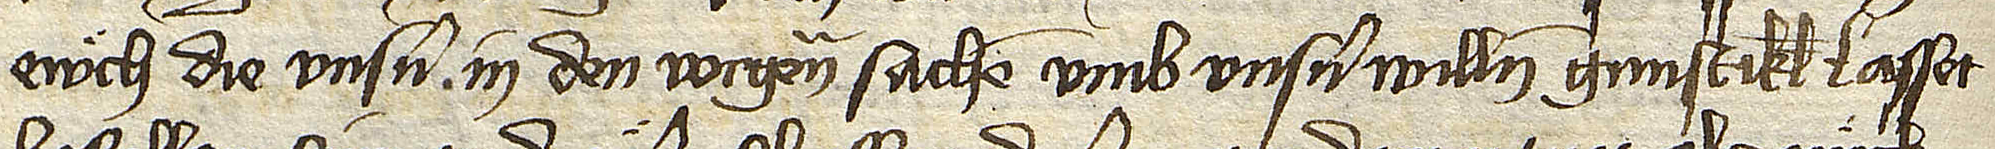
eẅch die vnſn* in den vorgen* ſache* vmb vnſn* willn* gunſtikl* laſſet
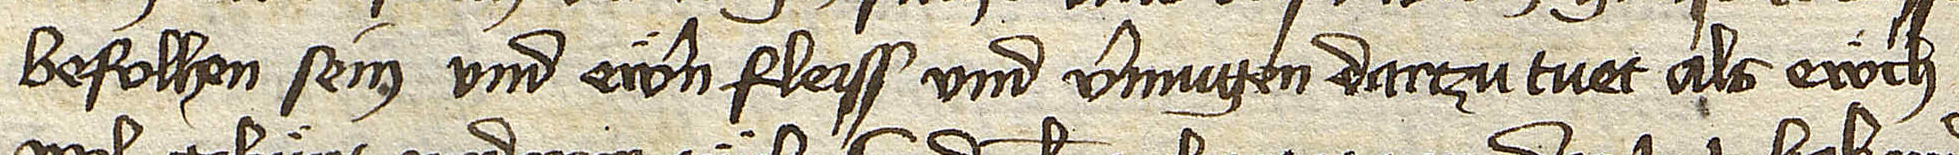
befolhen ſein vnd eẅ*n fleiſſ vnd v*mugen darcʒu tuet als eẅch
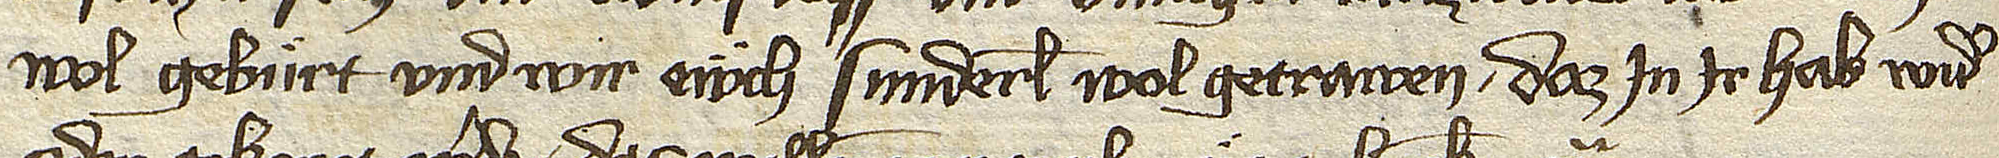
wol gebürt vnd wir eẅch ſunderl* wol getrawen / Daʒ In Ir hab wid*
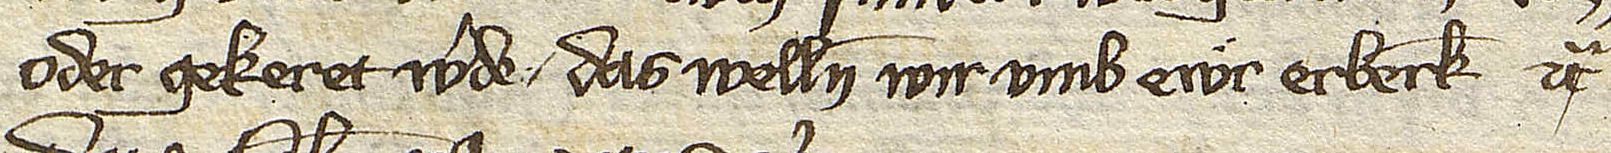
oder gekeret w*de / das welln* wir vmb eẅr erberk* ec*
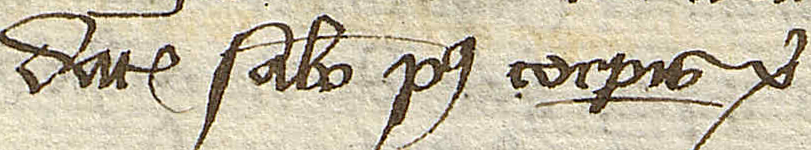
Dat* ſabo* p* corp*is x*
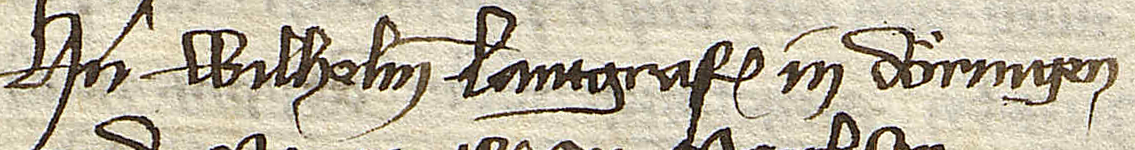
Hn* Wilhelm* lantgraf* in Döringen
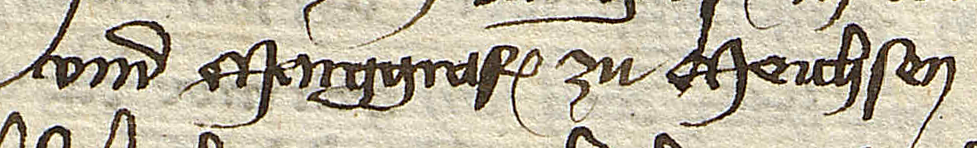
vnd Marggraf* ʒu Meichſen
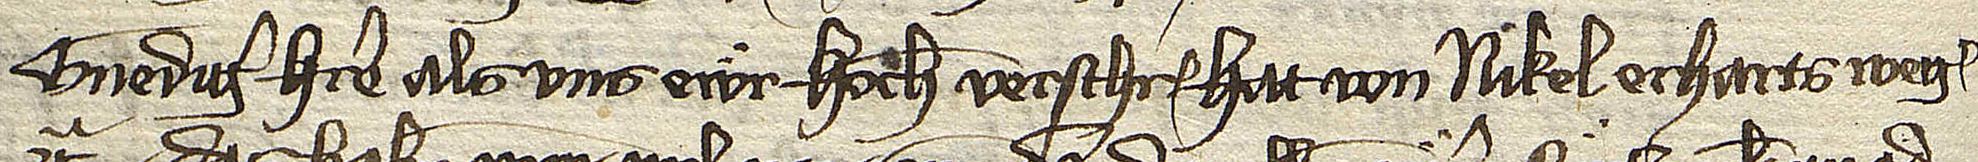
Gnedig* h*re als vns eẅr hoch* verſchr* hat von Nikel erharts weg*
